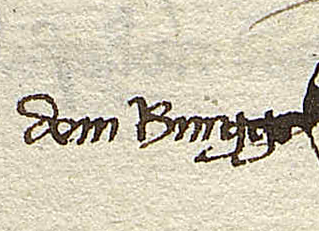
dem Burggr*
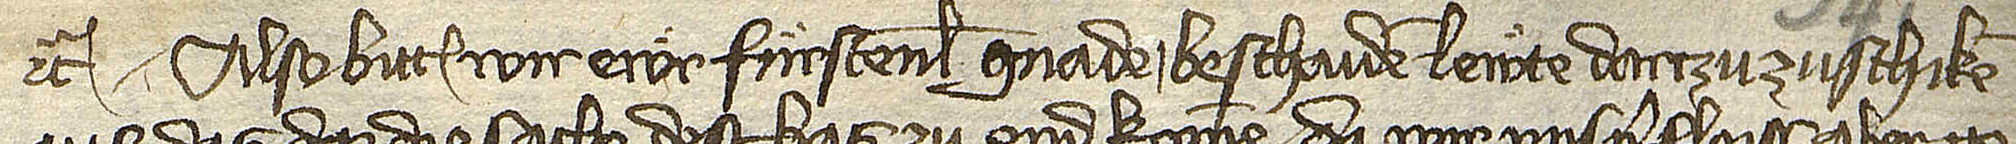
ec* / Alſo bitt* wir eẅr fürſtenl* gnade / beſchaide* leẅte darcʒu ʒu ſchike*
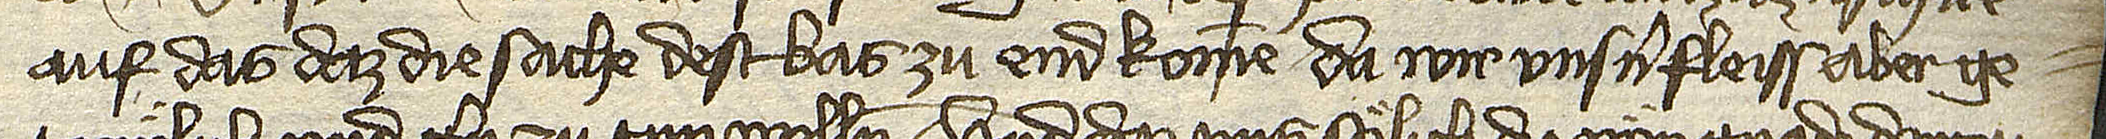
auf das daʒ die ſache deſt bas ʒu end kome* / Da wir vnſn* fleiſſ aber ge =
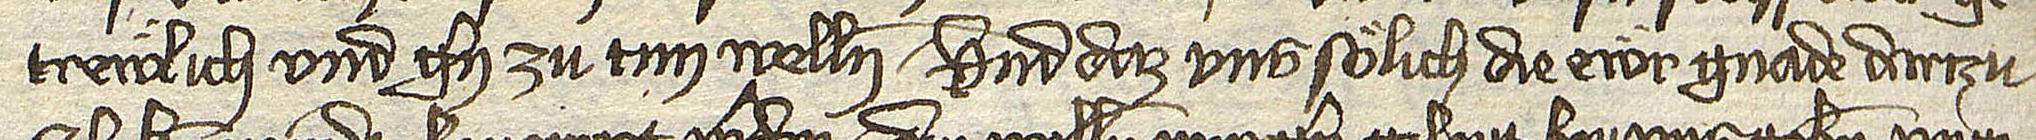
treẅlich vnd g*n ʒu tun welln* / Vnd daʒ vns ſölich die eẅr gnade darcʒu
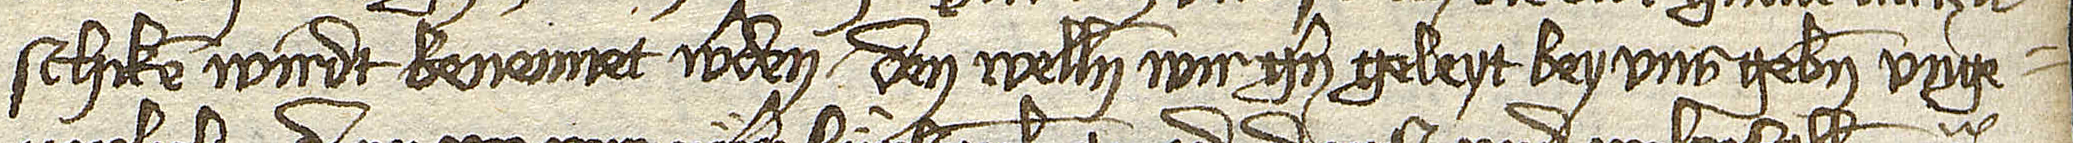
ſchike* wirdt benennet w*den / den welln* wir g*n geleyt bey vns gebn* vnge =
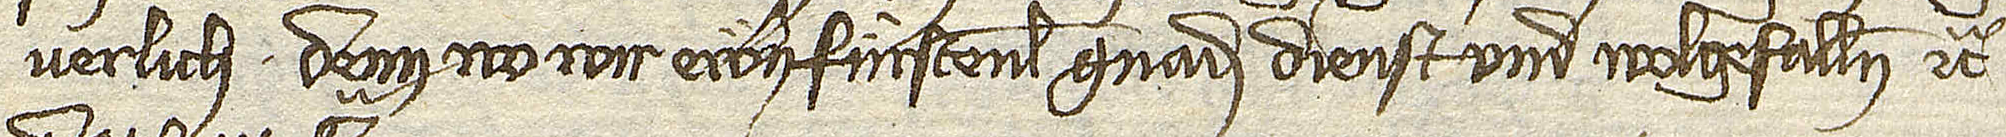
uerlich . Denn wo wir eẅ*n fürſtenl* gnad* dienſt vnd wolgefalln* ec*
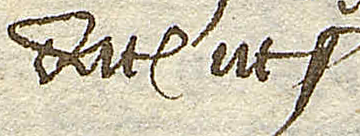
Dat* ut ſ*
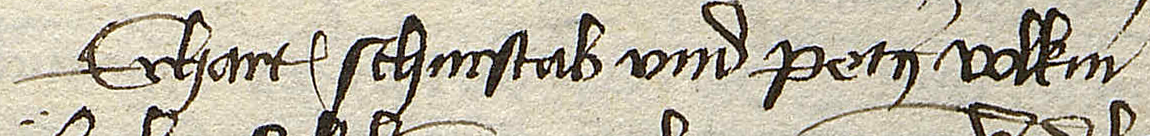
Erhart* ſchurſtab vnd Petn* volkm*
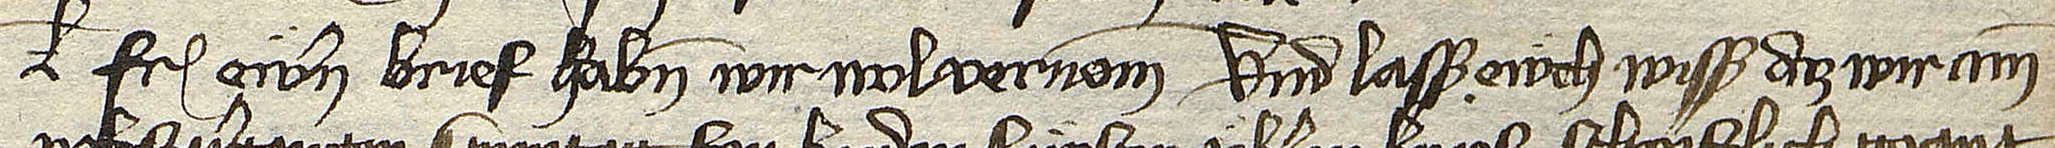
L* fr* eẅ*n brief habn* wir wol vernom* Vnd laſſ* eẅch wiſſ* daʒ wir am*
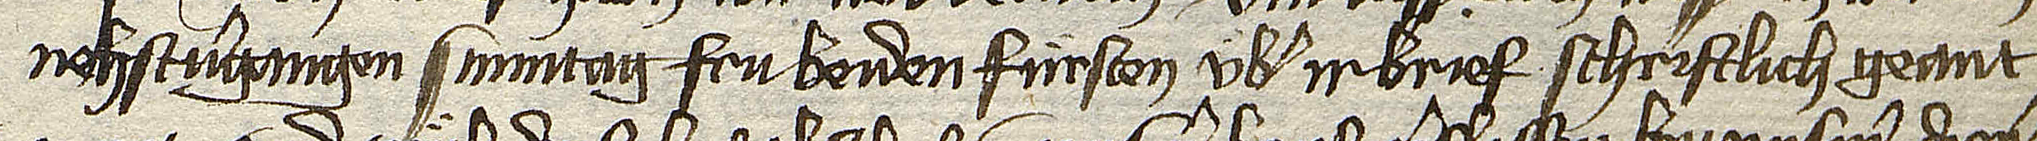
nehſtu*gangen ſunntag fru beiden fürſten v̈b* ir brief ſchriftlich geant
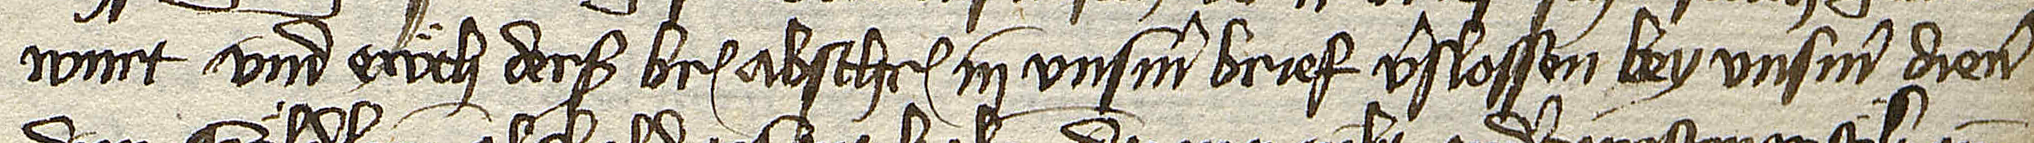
wurt / vnd eẅch derſ* br* abſchr* in vnſm* brief v*ſloſſen bey vnſm* dien*
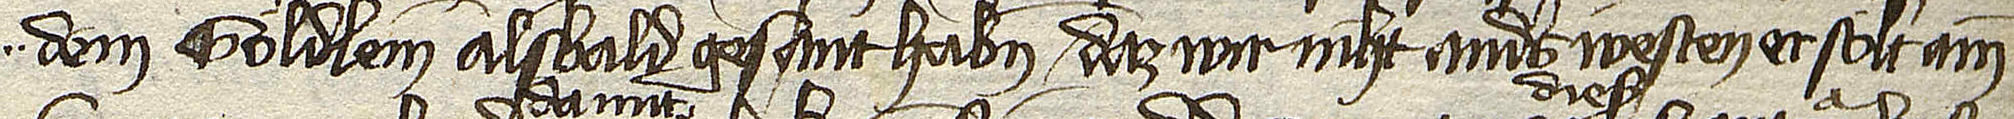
~ dem Göldlein alſbald geſant habn* / daʒ wir niht and*s weſten er ſölt am*
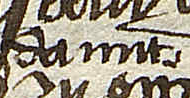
da mit
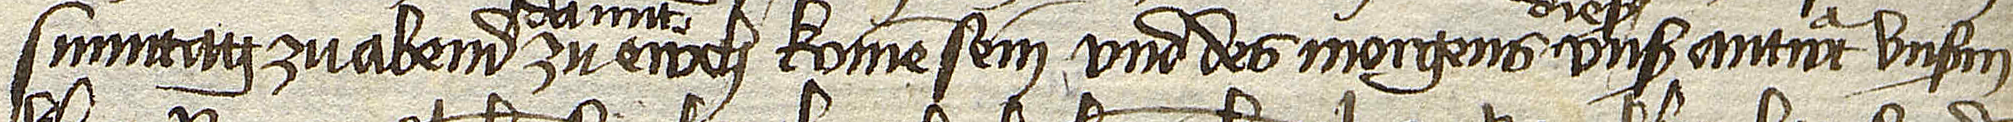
ſunntag ʒu abend ʒu eẅch kome* ſein vnd des morgens vnſ* antw*t vnſ*m
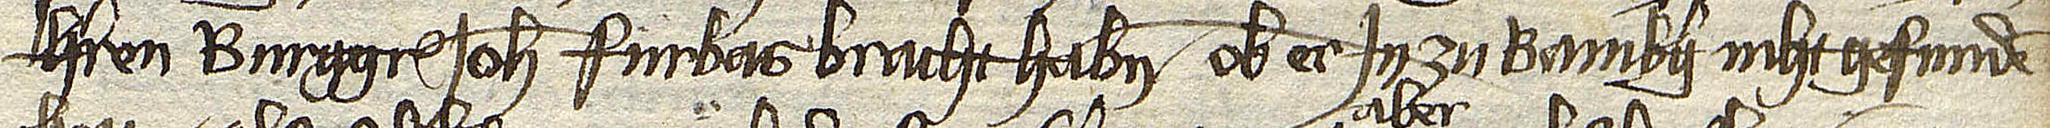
h*ren Burggr* Ioh* fürbas bracht habn* / ob er In ʒu Bamb*g niht gefunde*
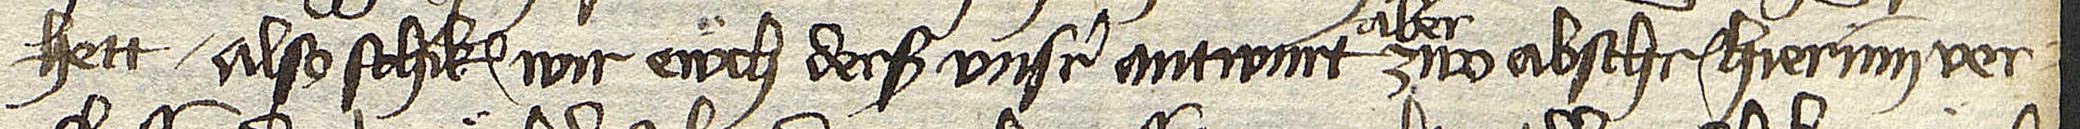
hett / alſo ſchik* wir eẅch derſ* vnſr* antwurt ʒwo abſchr* hierinn ver =
